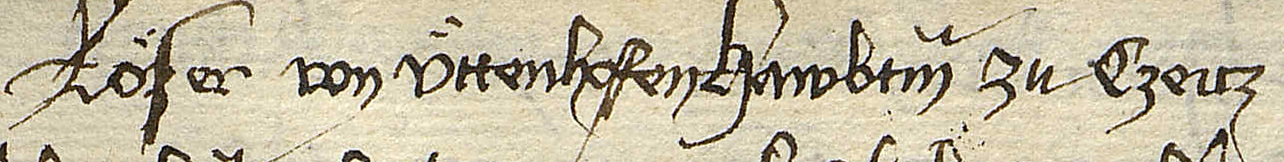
Löſer von V̈ttenhofen Hawbtm* ʒu Cʒeicʒ
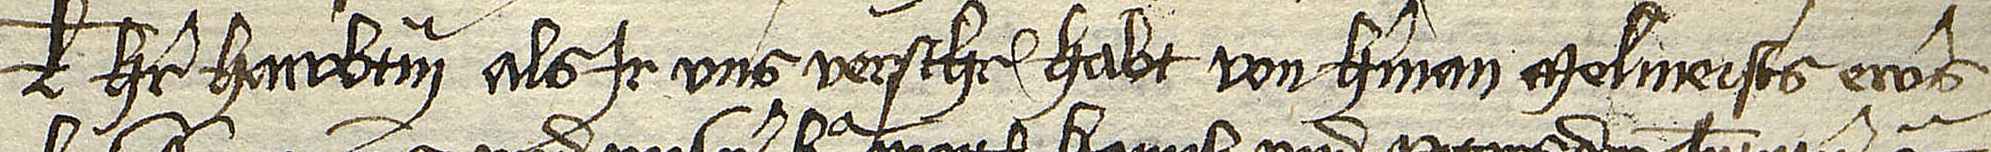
L* hr* hawbtm* als Ir vns verſchr* habt von h*man Melmeiſt*s ew*s
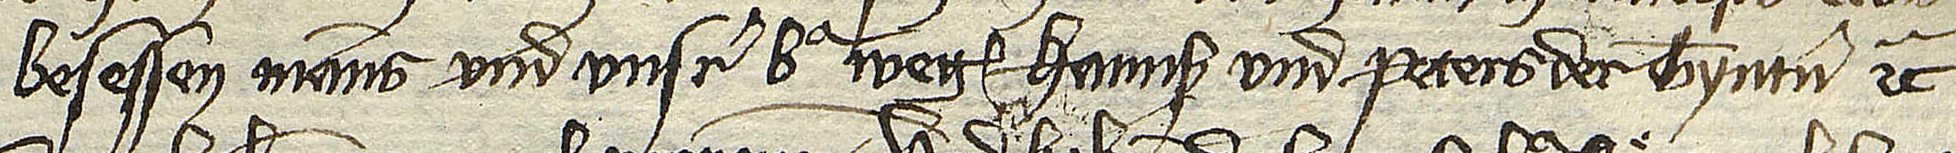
beſeſſen man*s vnd vnſr* b* weg* hannſ* vnd Peters der Tyntn* ec*
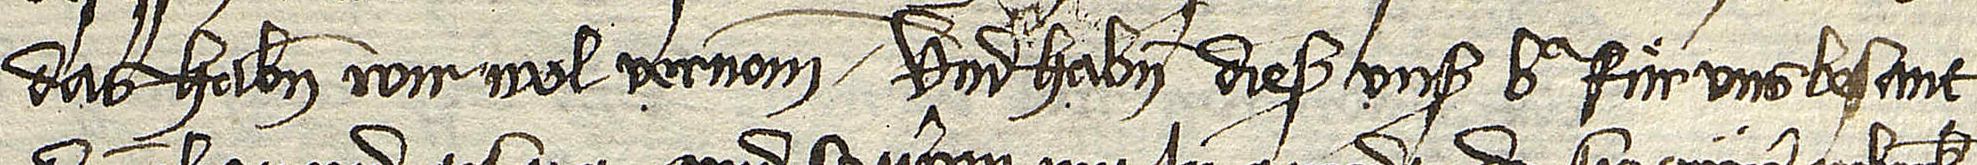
das habn* wir wol vernom* / Vnd habn* dieſ* vnſ* b* für vns beſant
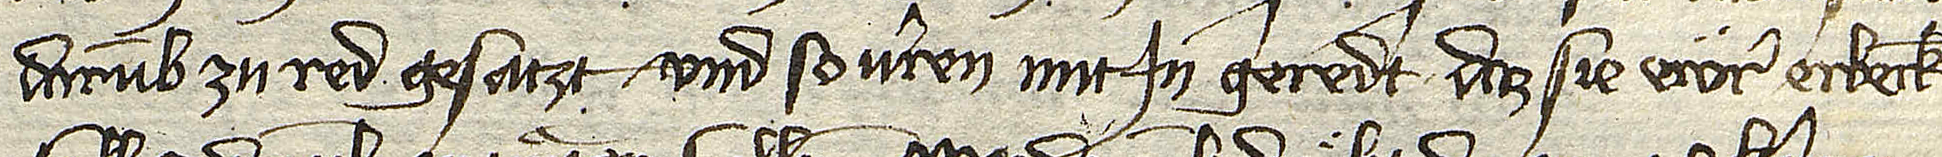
darub* ʒu red geſacʒt / vnd ſo u*ren mit In geredt / daʒ ſie eẅr* erberk*
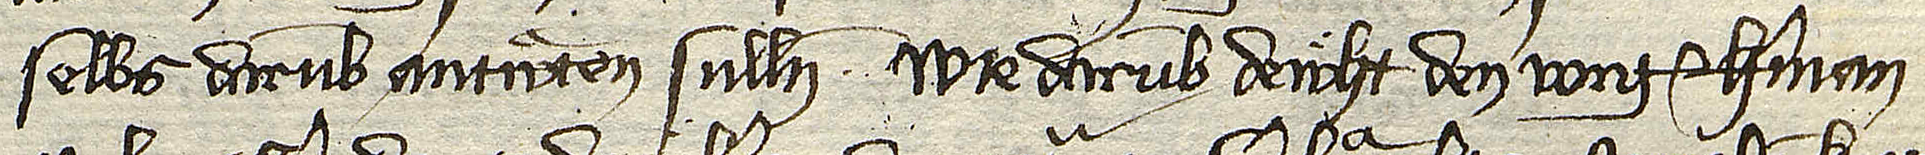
ſelbs darub* antw*ten ſulln* . wie darub* deẅht den vorg* h*man
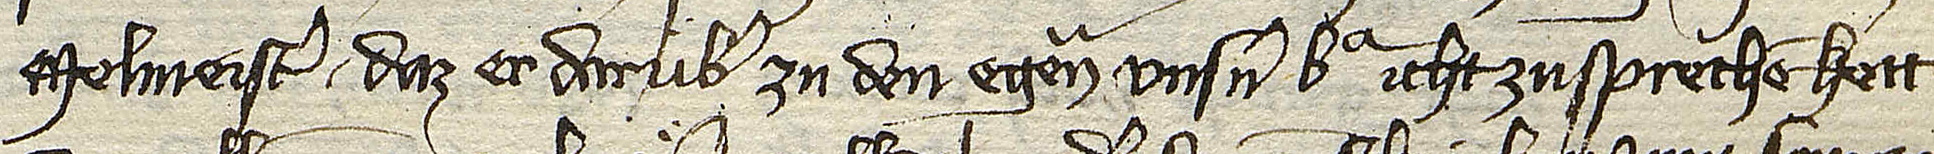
Melmeiſt* / daʒ er darüb* ʒu den egen* vnſn* b* icht ʒu ſpreche* hett
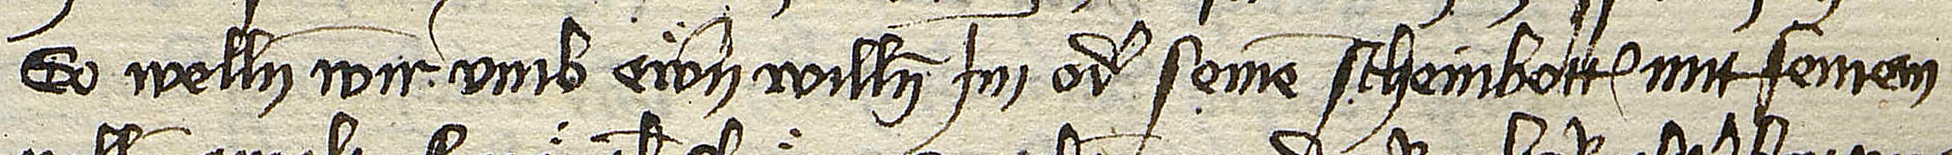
So welln* wir vmb eẅ*n willn* Im od* ſeine* ſcheinbott* mit ſeinem
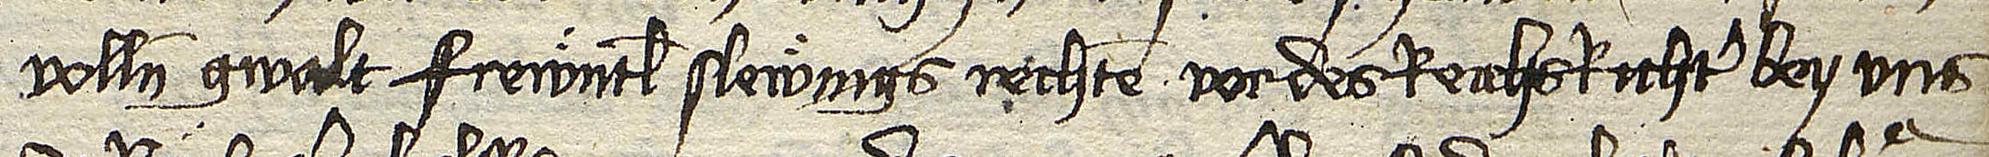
volln* gwalt freẅntl* ſleẅnigs rechte* vor des Reich Richt* bey vns
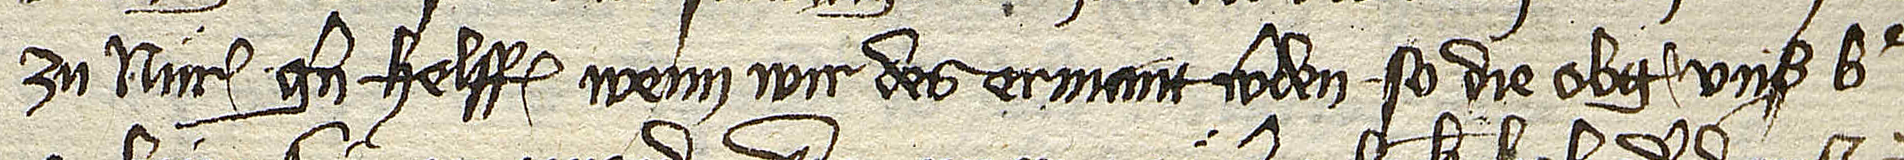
ʒu Nür* g*n helff* wenn wir des ermant w*den . ſo die obg* vnſ* b*
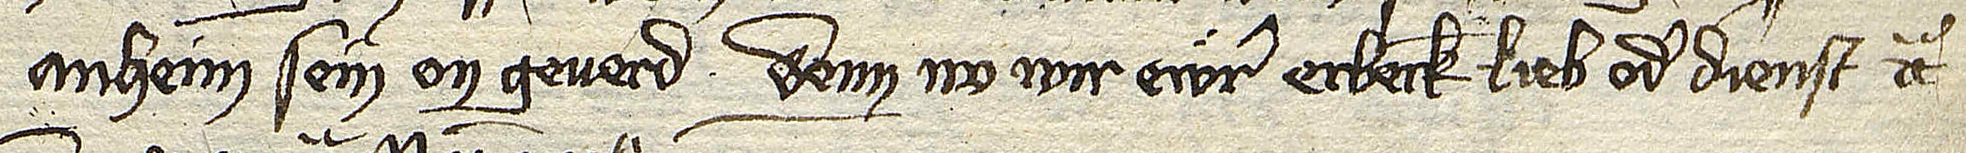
anheim ſein on geuerd . Denn wo wir eẅr* erberk* lieb od* dienſt ec*
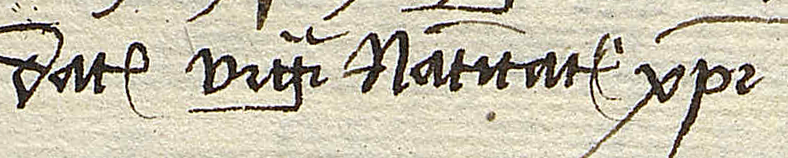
Dat* vigi* Natitat* xpi*
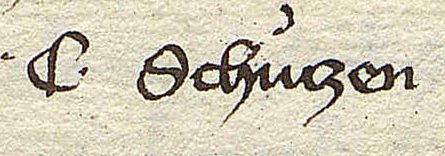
C* Schücʒen
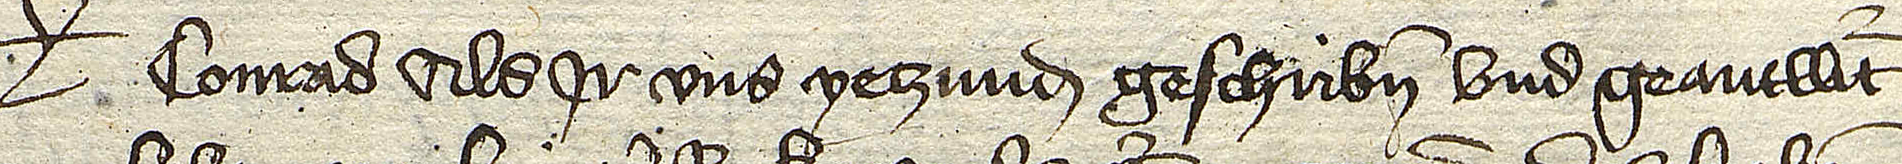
L* Conrad Als Ir vns yecʒund* geſchribn* vnd geantw*t
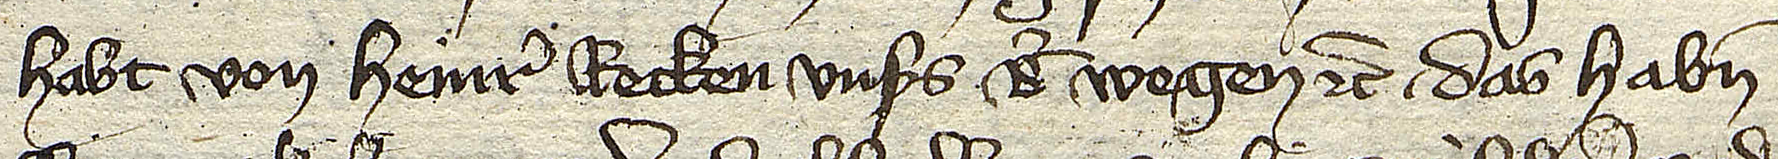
habt von heinr* Recken vnſ*s B* wegen ec* / Das habn*
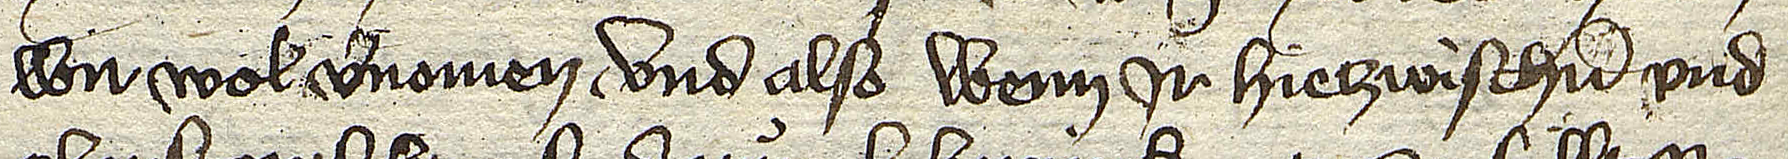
wir wol v*nomen / Vnd alſo wenn Ir hiecʒwiſchn* vnd
